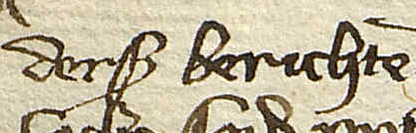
derſ* berichte*
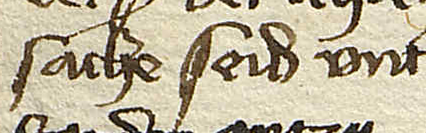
ſache ſeid vnt*
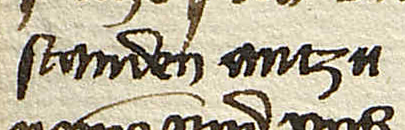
ſtanden ancʒu
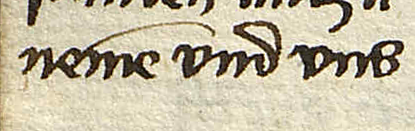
neme* vnd vns
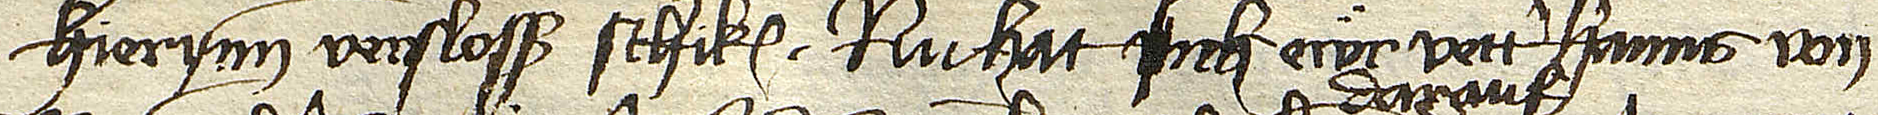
Hierynn* verſloſſ* ſchik* / Nu hat ſich ewr vett* Hanns von
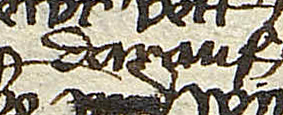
darauf
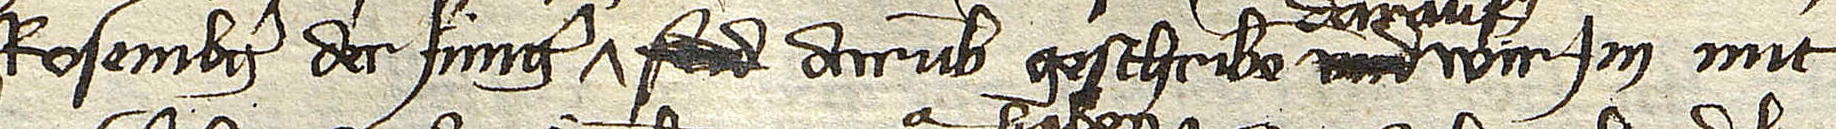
Roſemb*g der Iüng* ſeid daru*b geſchribe* vnd wir Im mit
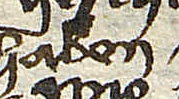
haben
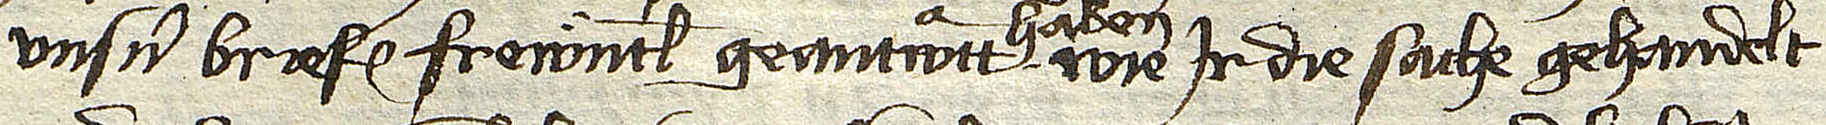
vnſ*n brief* frewntl* geantw*tt wie Ir die ſache gehandelt
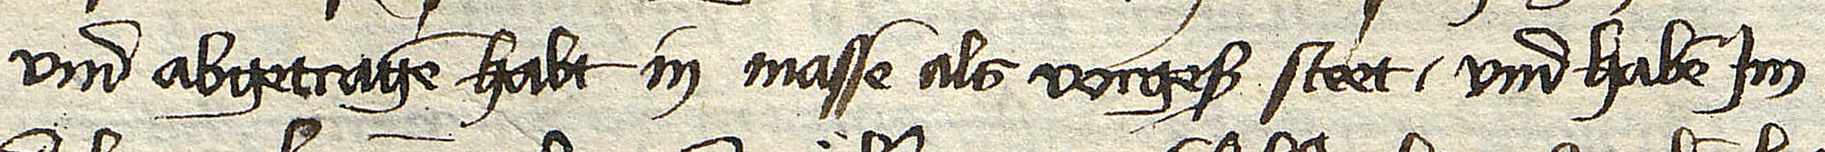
vnd abgetrage* habt in maſſe als vorgeſ* ſteet / vnd habe* Im
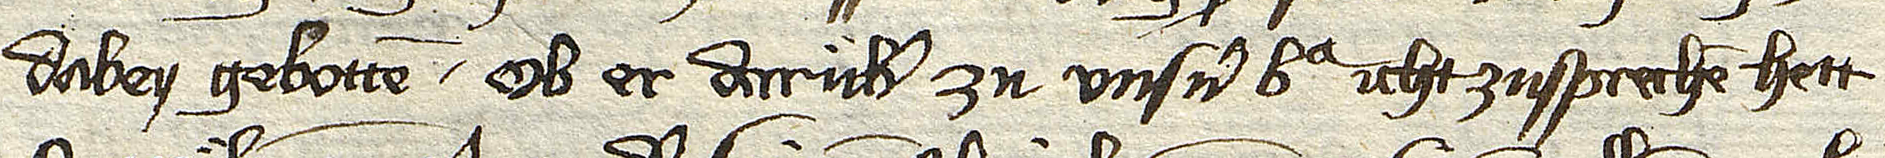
dabey gebotte* / Ob er darüb* ʒu vnſ*n b* icht ʒuſpreche* hett
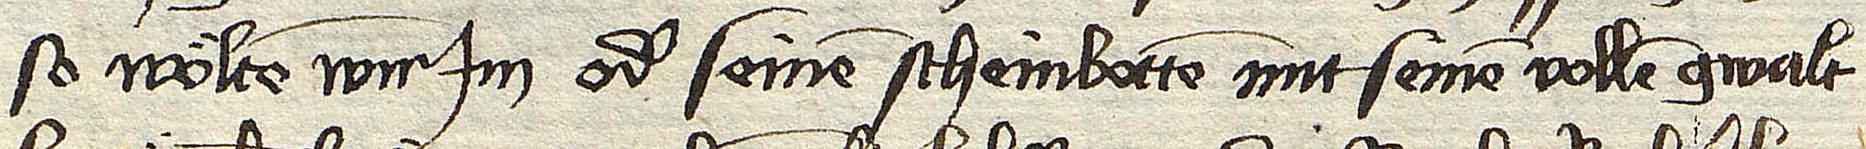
ſo wölte* wir Im od* ſeine* ſcheinbotte* mit ſeine* volle* gwalt
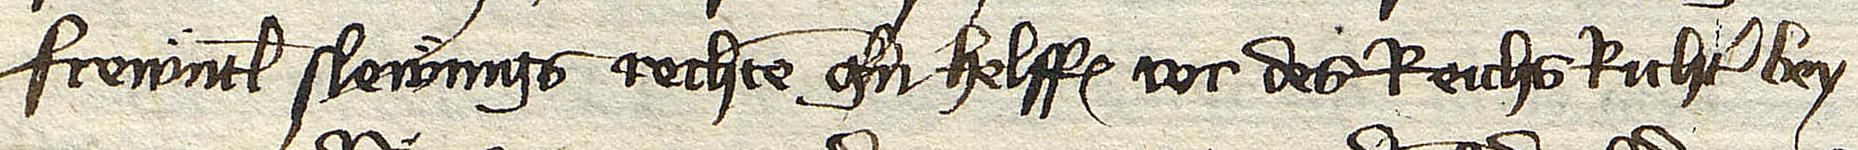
frewntl* ſlewnigs rechte* g*n helff* vor des Reichs Richt* bey
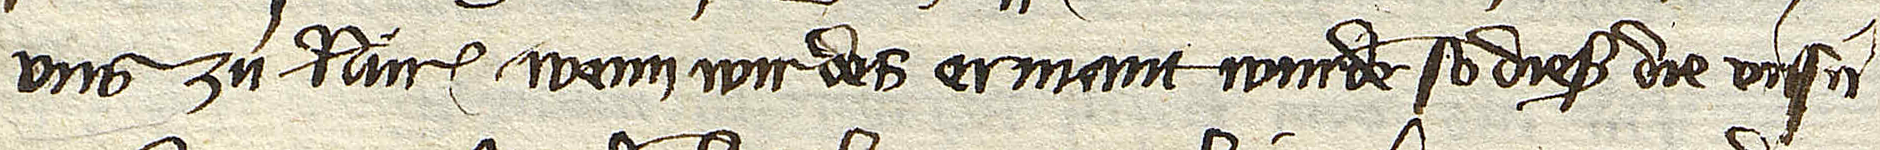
vns ʒu Nür* / wenn wir des ermant wurde* ſo dieſ* die vnſ*n
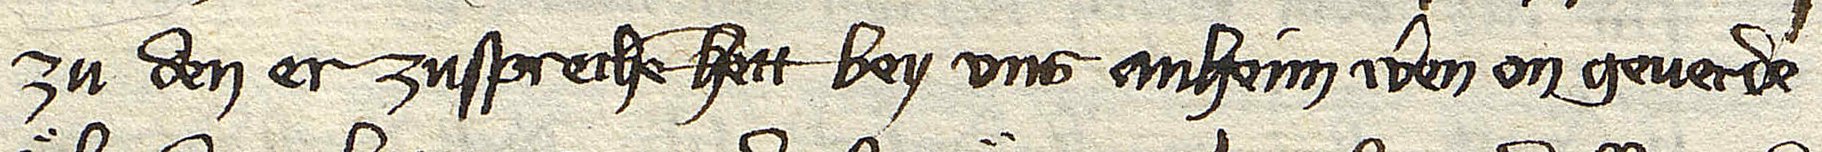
ʒu den er ʒuſpreche* hett bey vns anheim w*en on geuerde
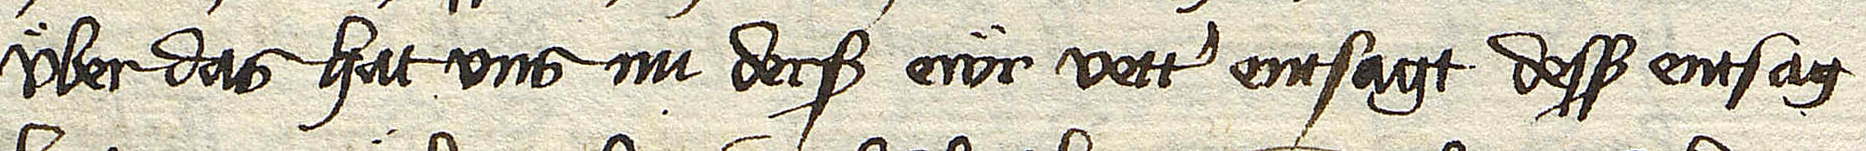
v̈ber das hat vns nu derſ* ewr vett* entſagt deſſ* entſag
